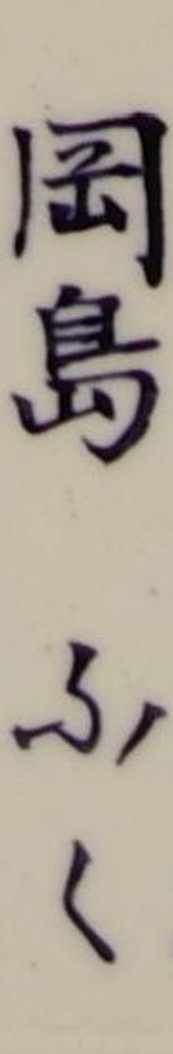岡島ふく
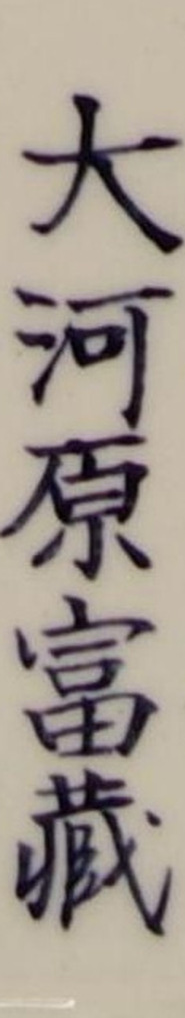大河原富蔵
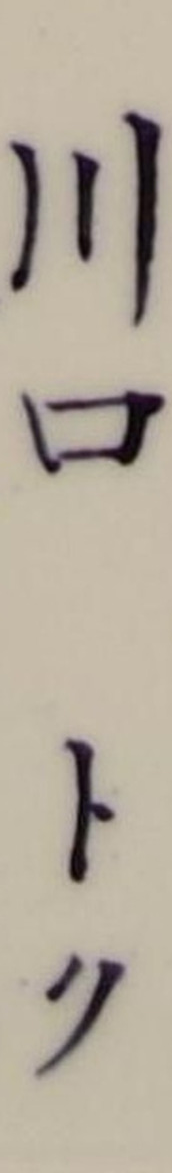川口トク
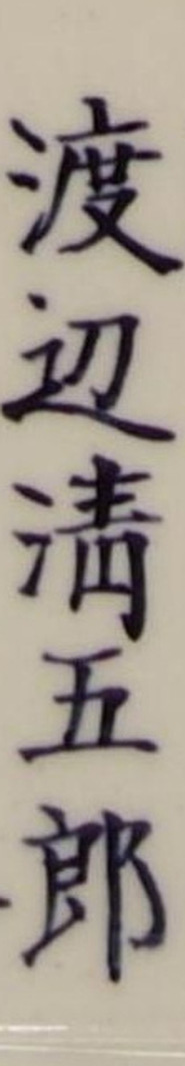渡辺清五郎
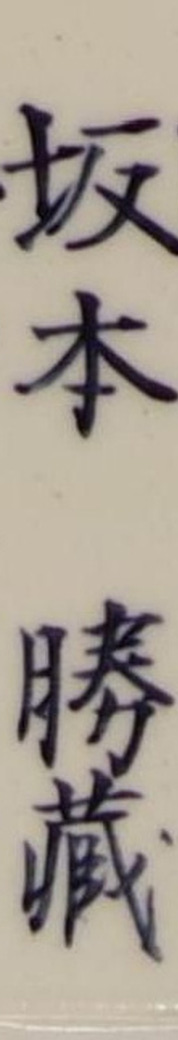坂本勝蔵
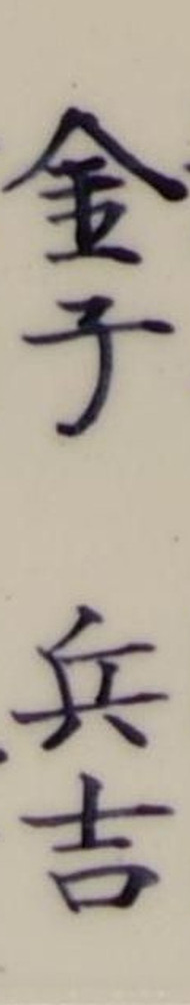金子兵吉
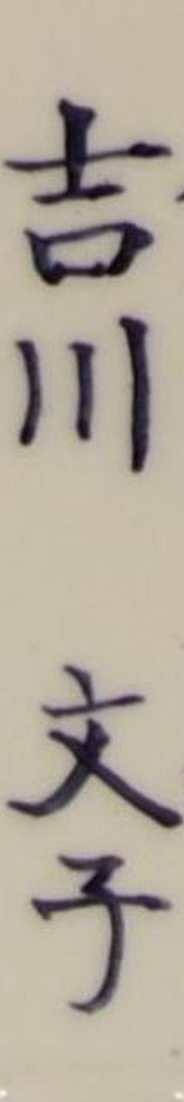吉川文子
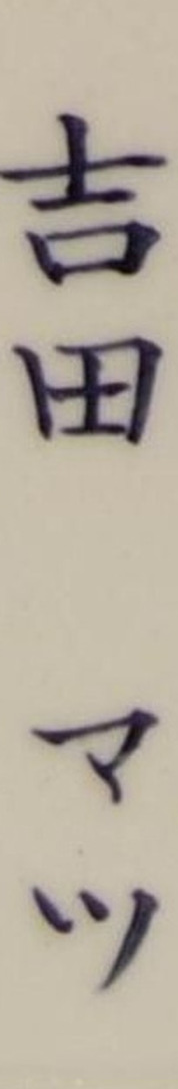吉田マツ
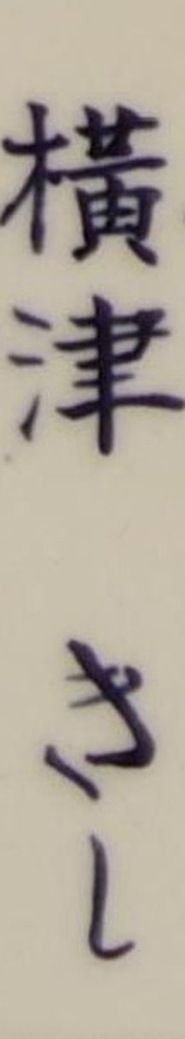横津きし
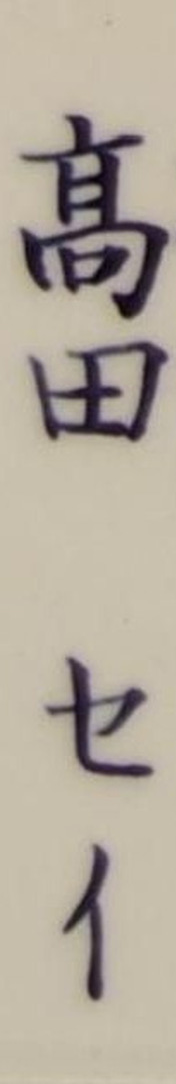高田セイ

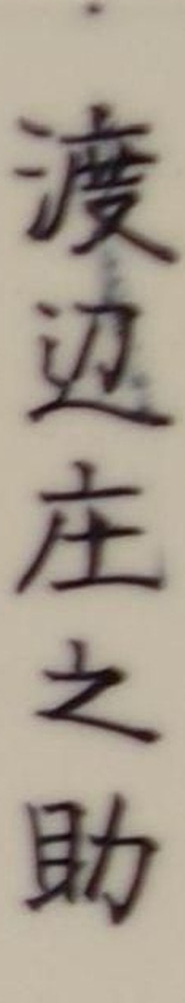渡辺庄之助
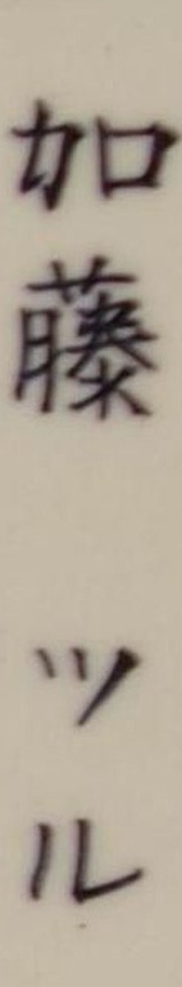加藤ツル
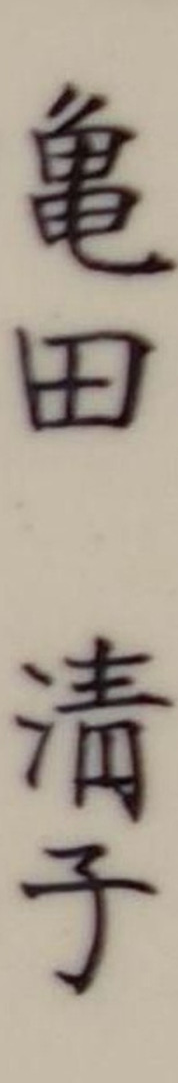亀田清子
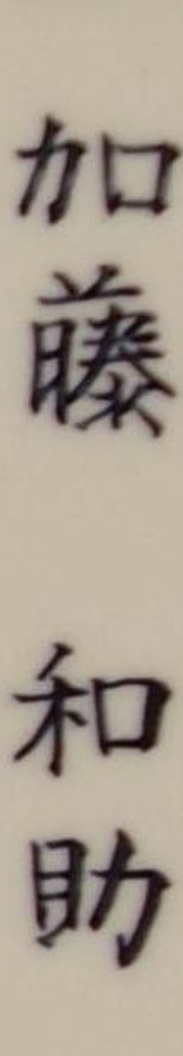加藤和助
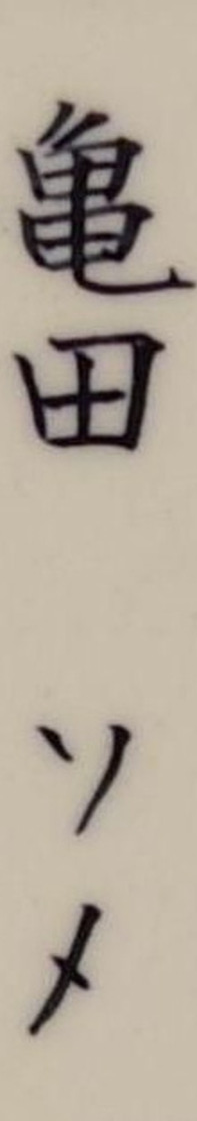亀田ソメ
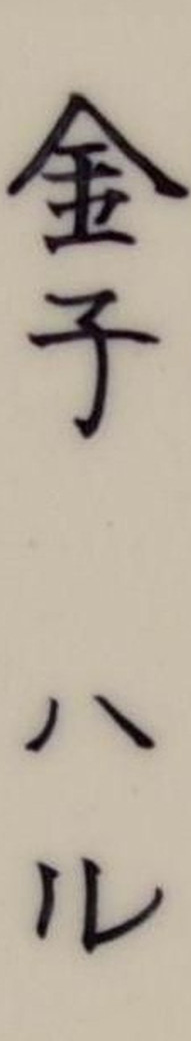金子ハル
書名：M~S
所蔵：高野山金剛峯寺
